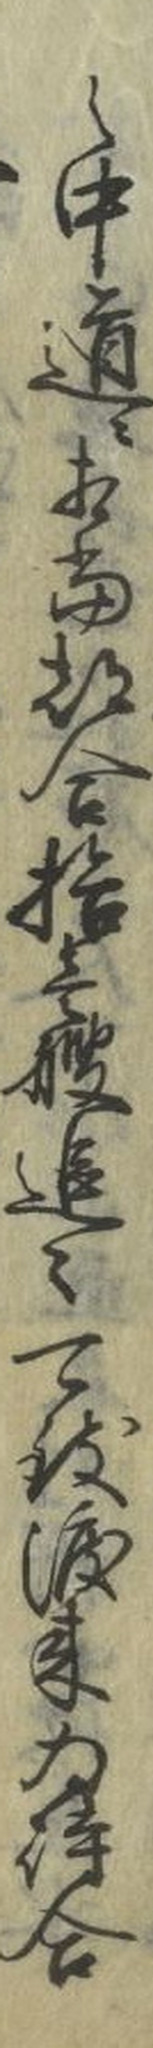之中道に相当都合拾壱艘追々可致渡来為待合
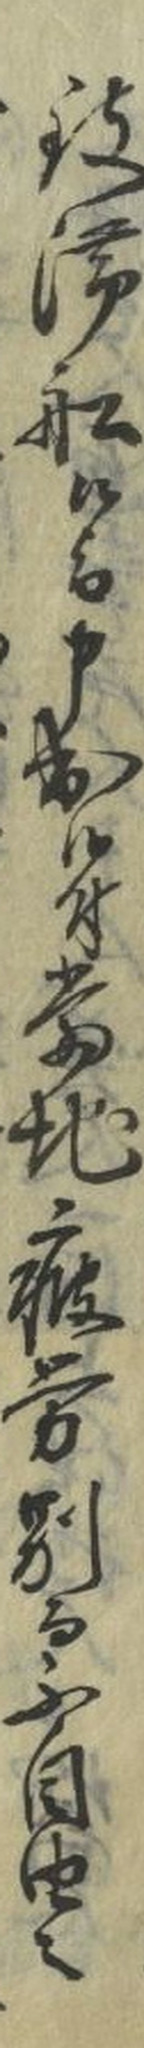致滞船候旨申出候付当地疲労別而不自由也
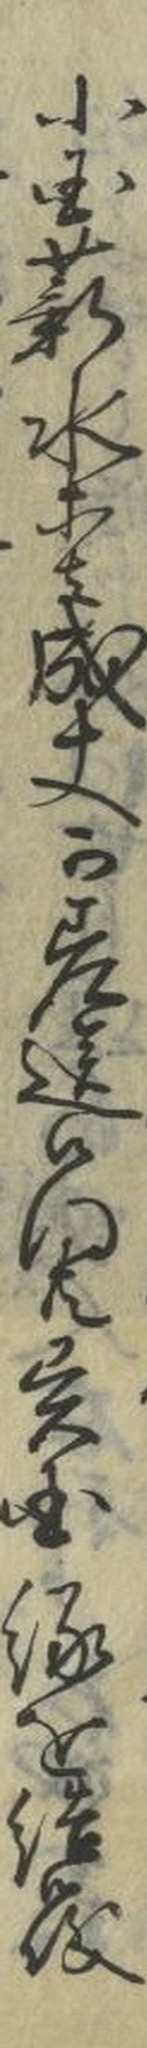小国薪水等は成丈可差送候得共異国縁を結候儀
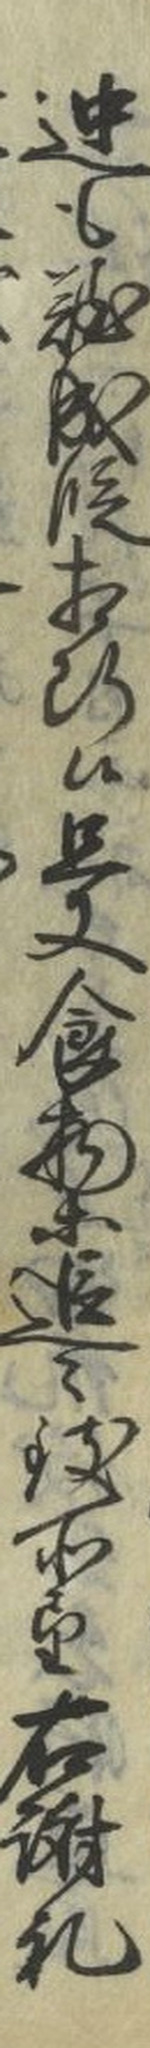迚も難成段相断候且又食物等追々致所望右謝礼
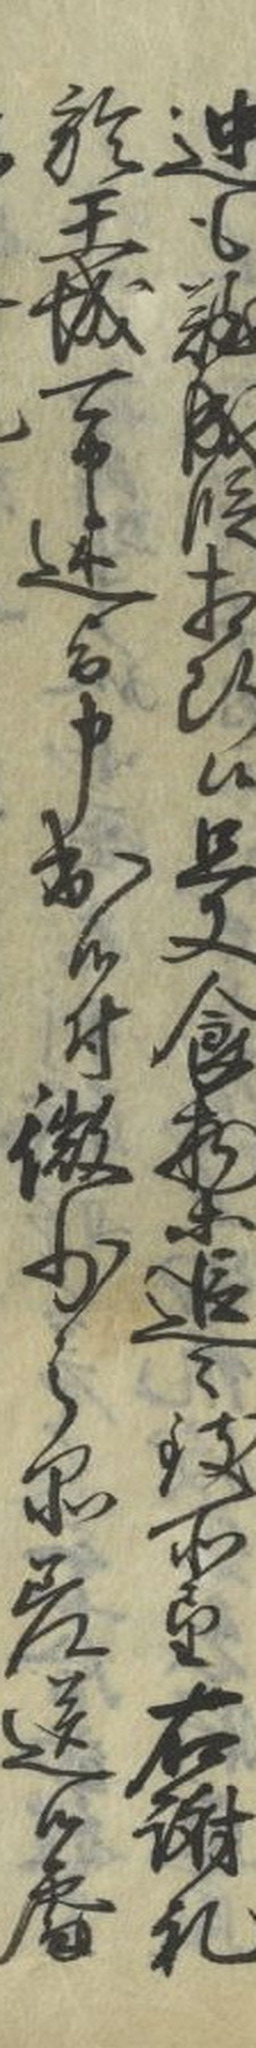於王城可申述旨申出候付微少之品差送候処
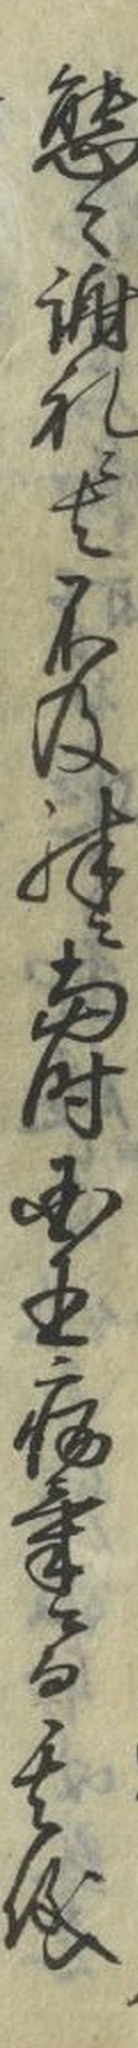態々謝礼には不及殊に当時国王病気に而其儀
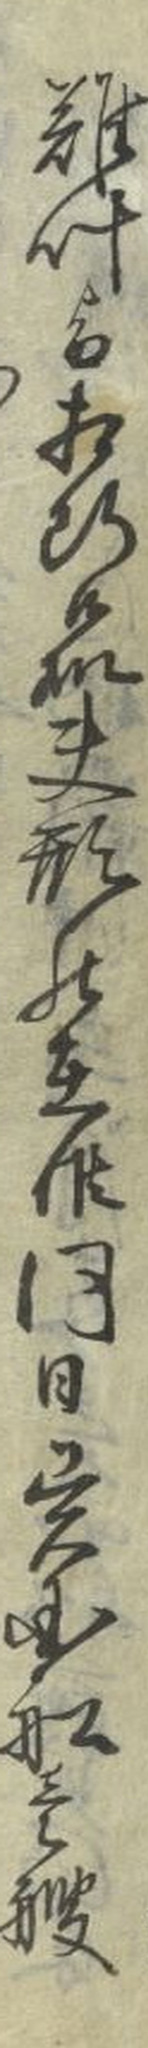難叶旨相断候処夫形罷在候同日異国船壱艘
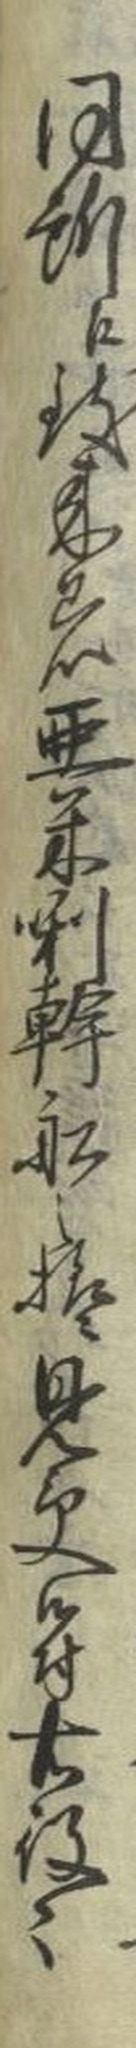同所え致来着亜米唎幹船之様に見受候付右役々
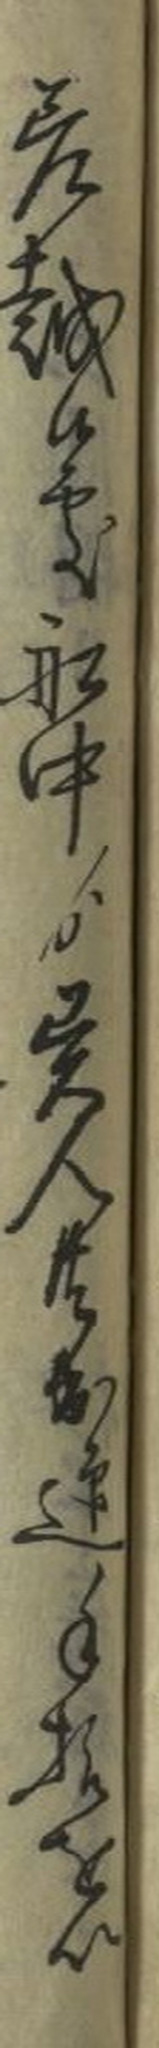差越候処船中ゟ異人共出迎手招を以
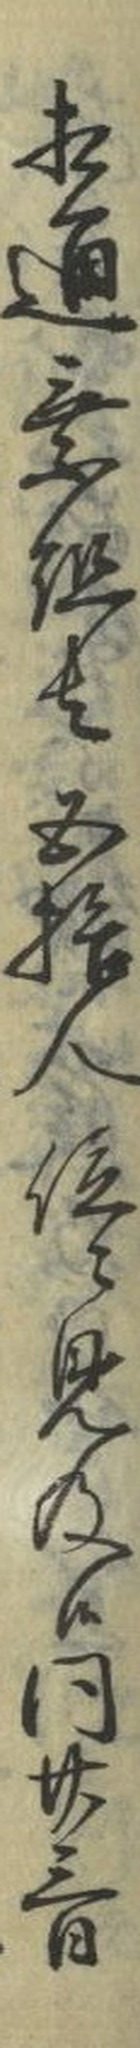相通乗組は五拾人位に見及候同廿三日
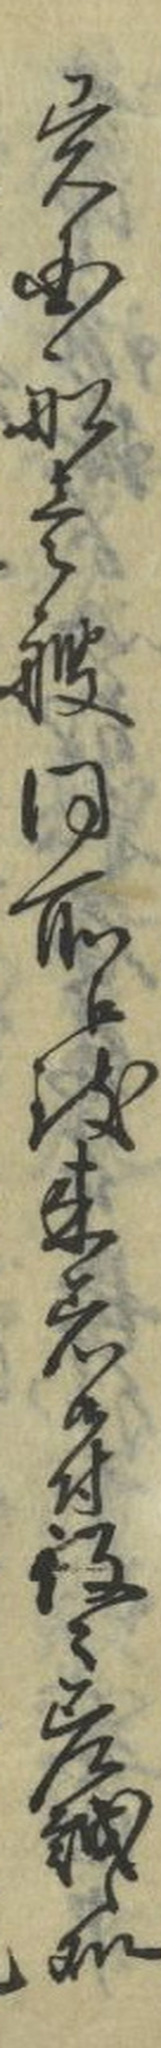異国船壱艘同所え致来着候付役々差越候処
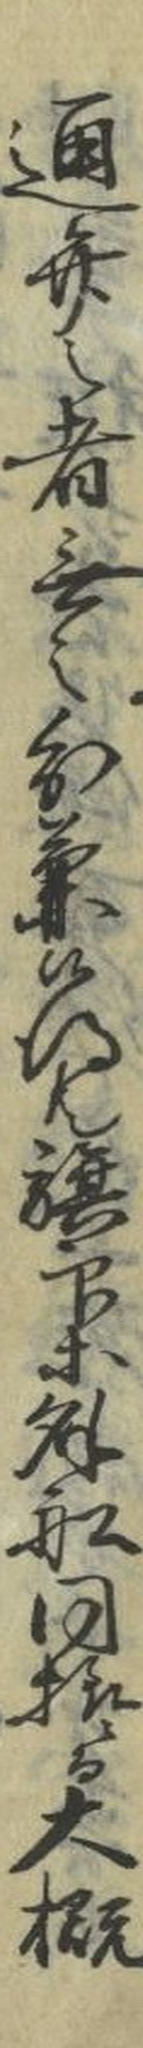通弁之者無之分兼候得共旗印等外船同様に而大概
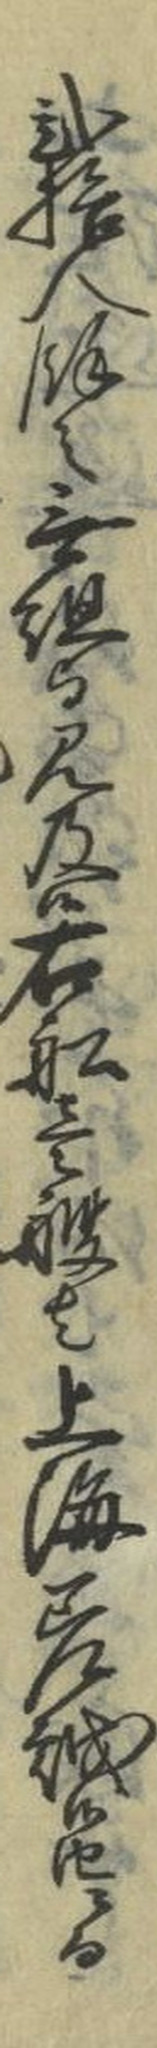弐拾人余之乗組と見及候右船壱艘は上海差越候由に而
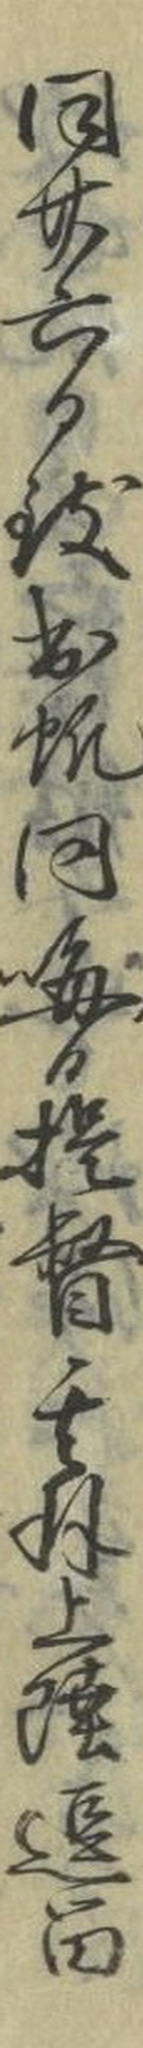同廿六日致出帆同晦日提督其外上陸逗留
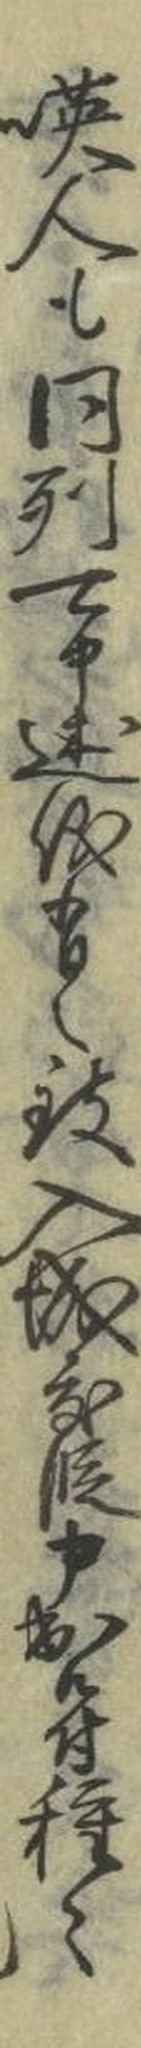𠸄人も同列可申述儀有之致入城度段申出候付種々
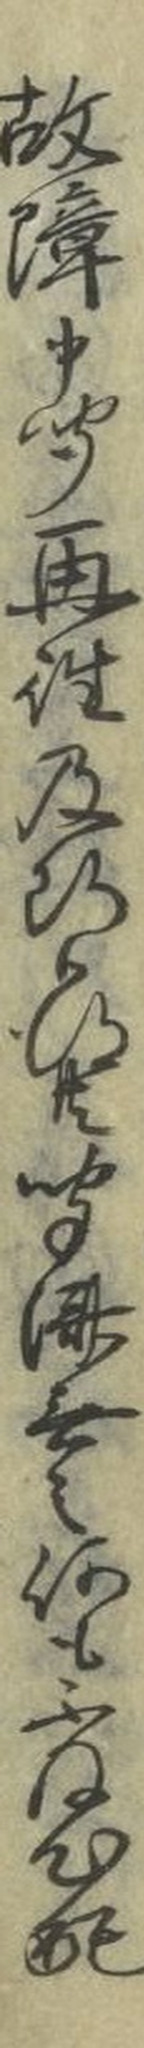故障申聞再往及断候得共聞済無之何も不為心配
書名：琉球へアメリカ船渡来書
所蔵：University of the Ryukyus Library
